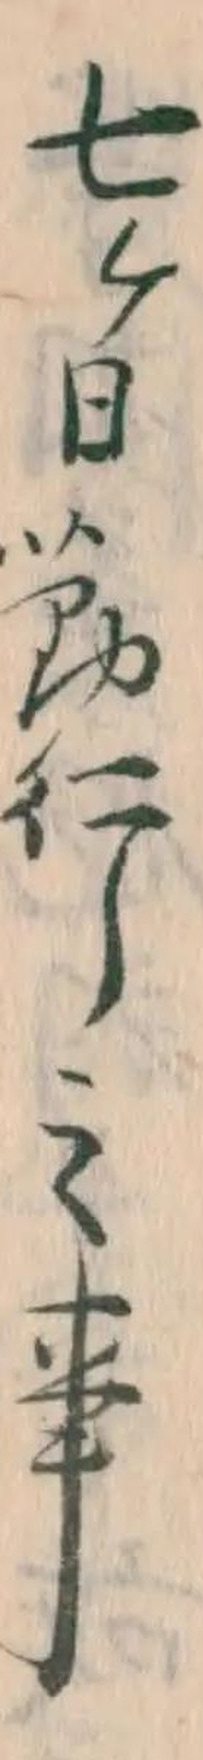七ヶ日勤行之事
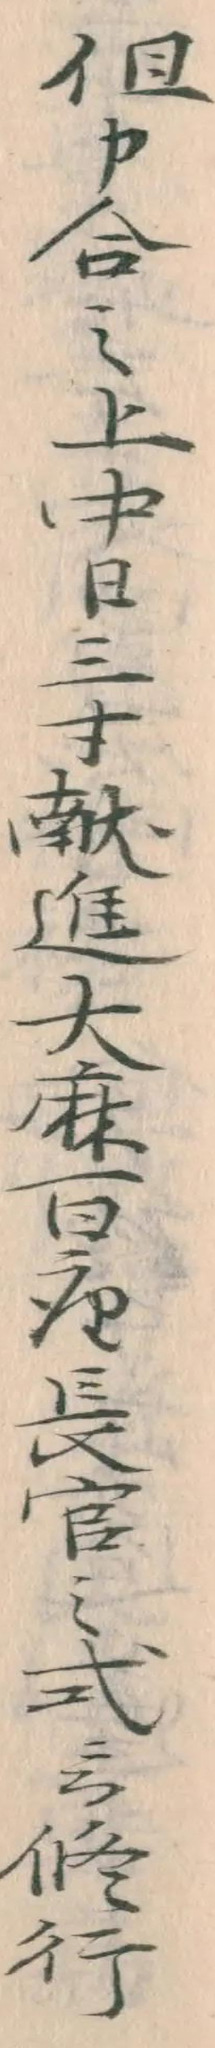但申合之上中日三寸献進大麻百座長官之式ニ而修行
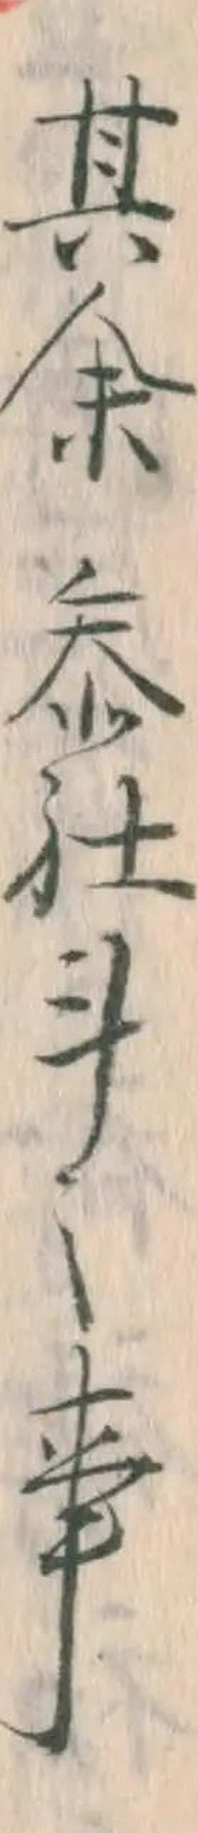其余参社斗之事
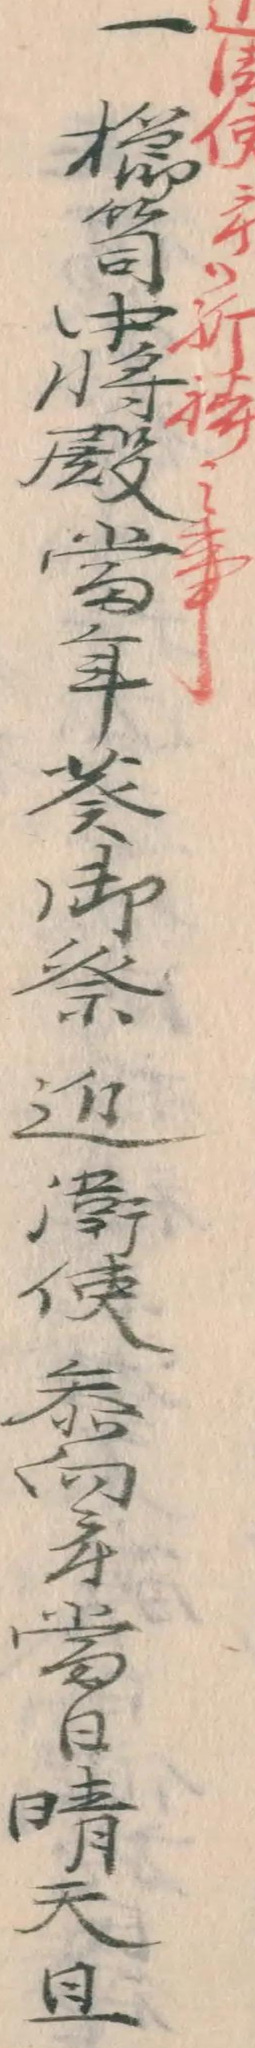一櫛笥中将殿當年葵御祭近衛使参向ニ付當日晴天且
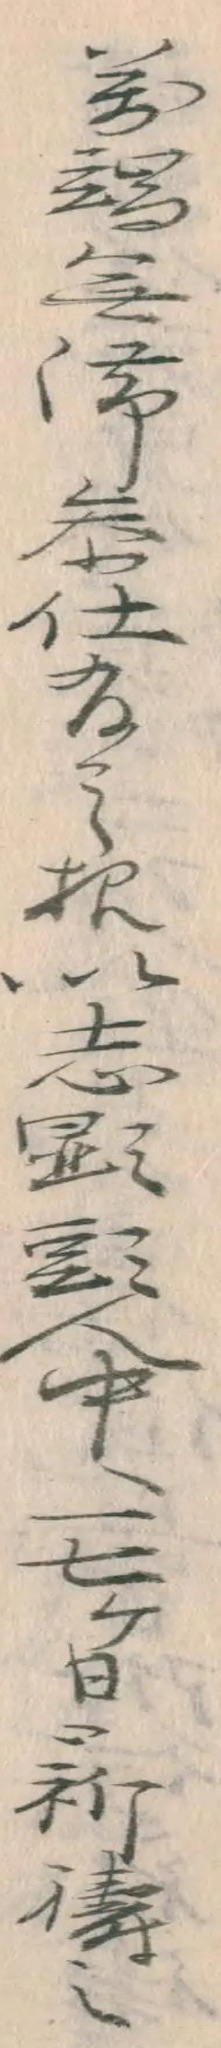萬端無滞参仕有之様以志顕頭人中へ一七ヶ日御祈祷之
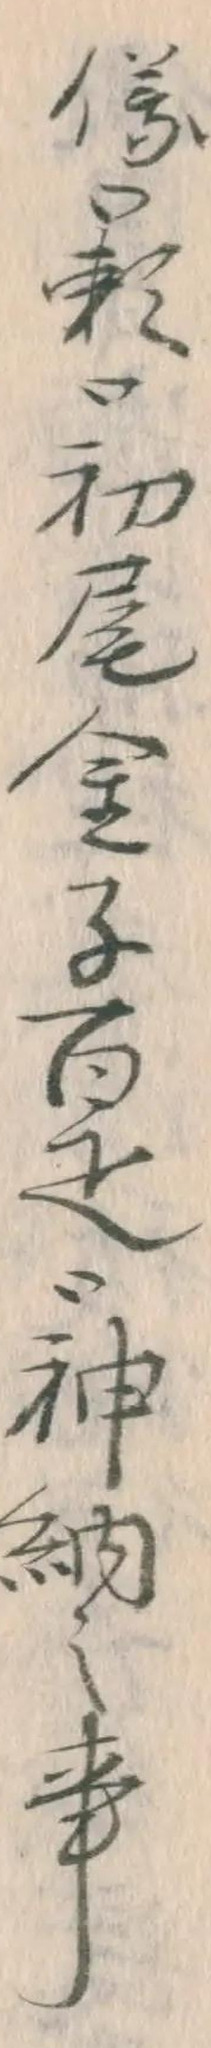儀御頼御初尾金子百疋御神納之事
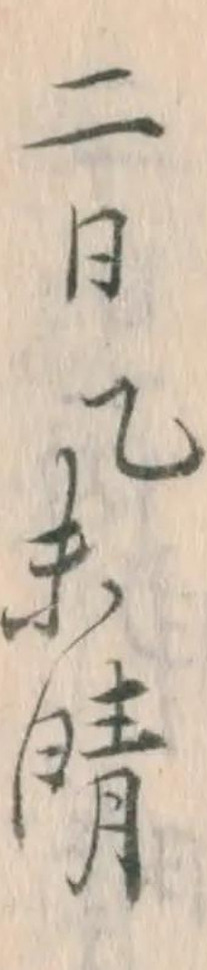二日乙未晴
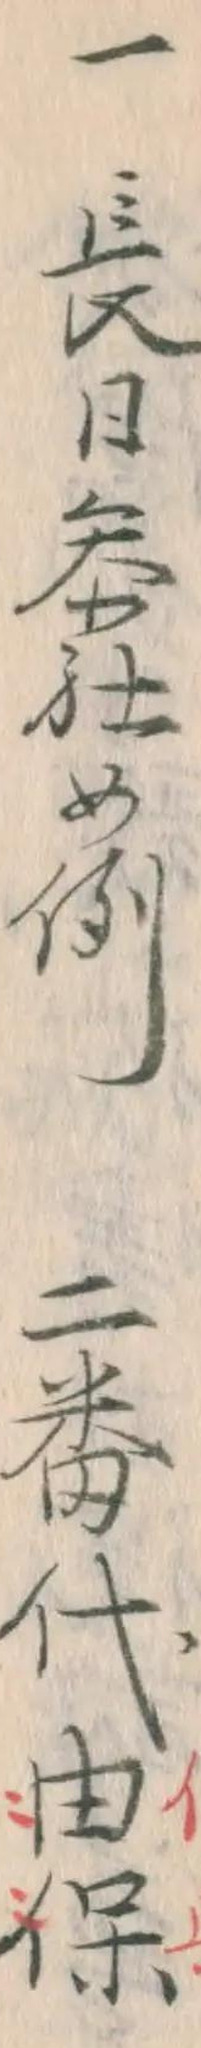一長日参社如例二番代由保
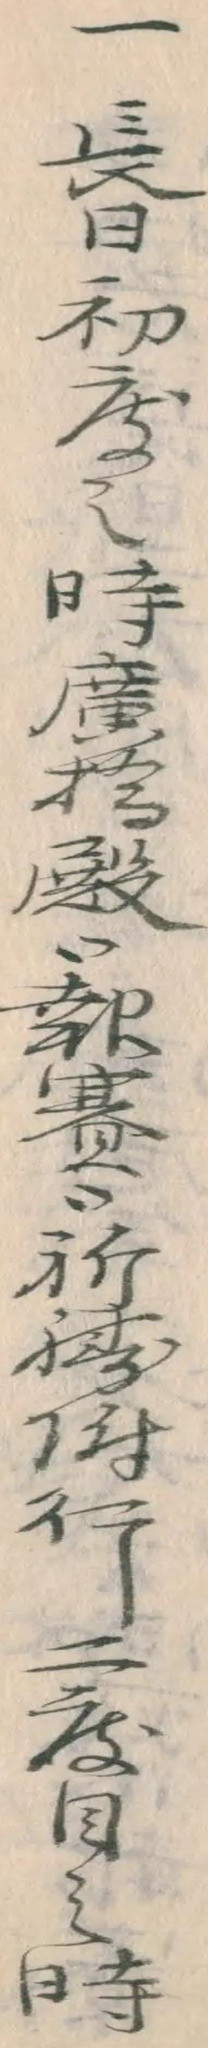一長日初度之時廣橋殿御報賽御祈祷附行二度目之時
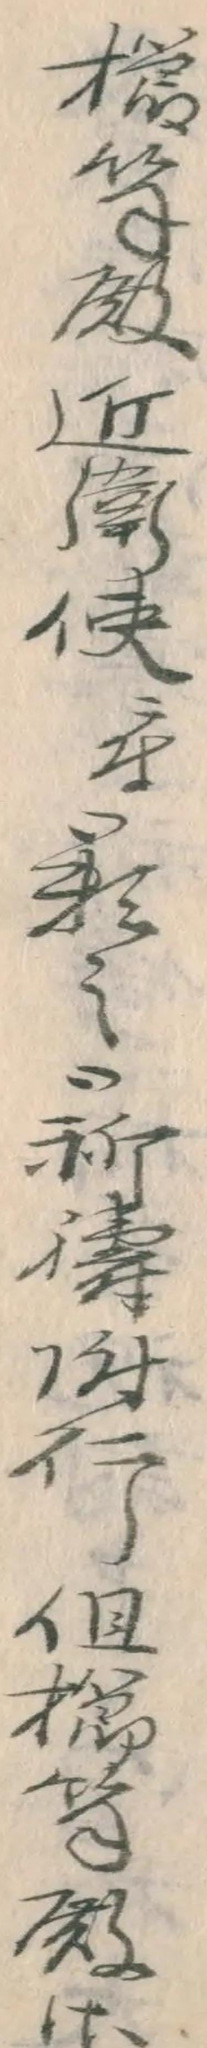櫛笥殿近衛使ニ付御頼之御祈祷附行但櫛笥殿等
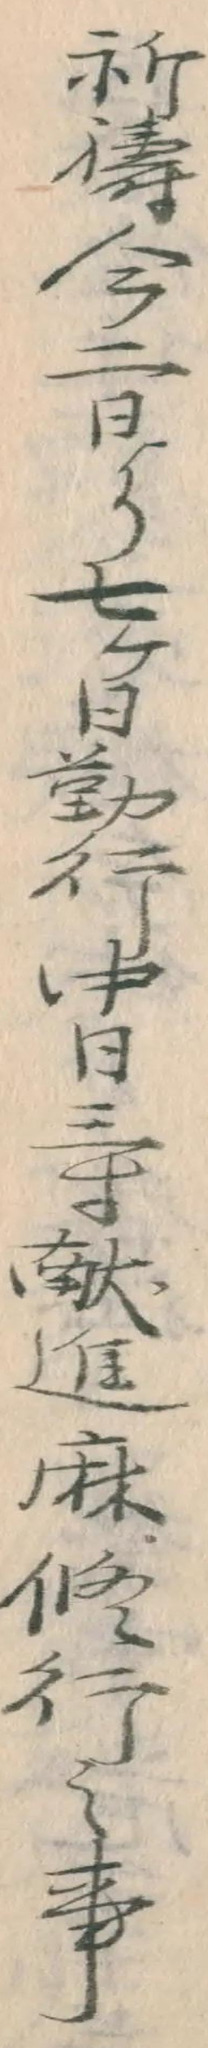祈祷今二日より七ケ日勤行中日三寸献進麻修行之事

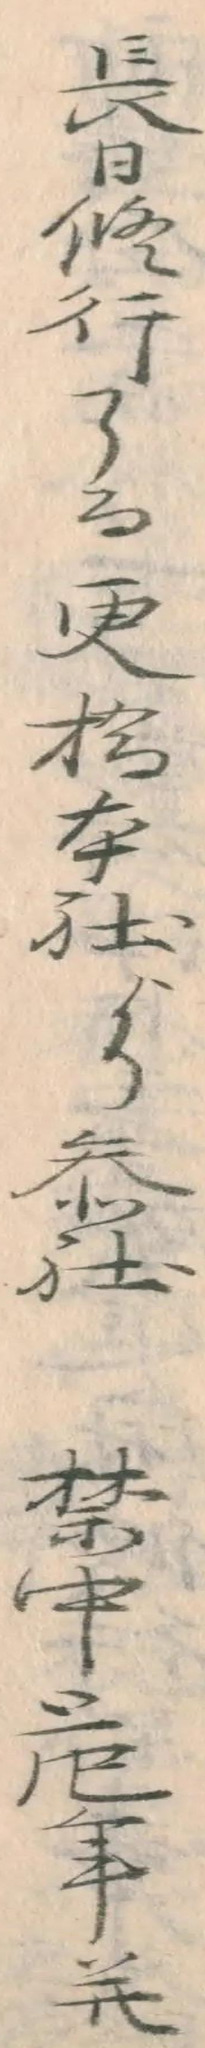一長日修行了而更橋本社より参社禁中御厄年并
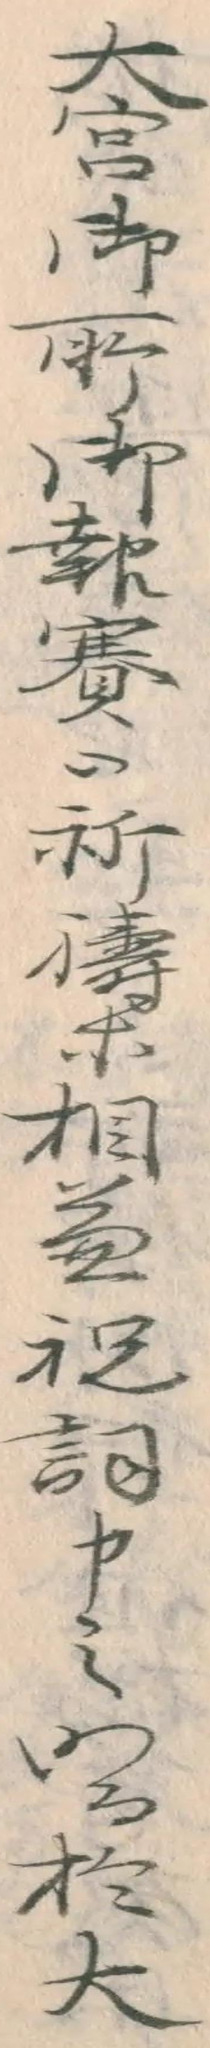大宮御所御報賽御祈祷等相兼祝詞申之仍而於大
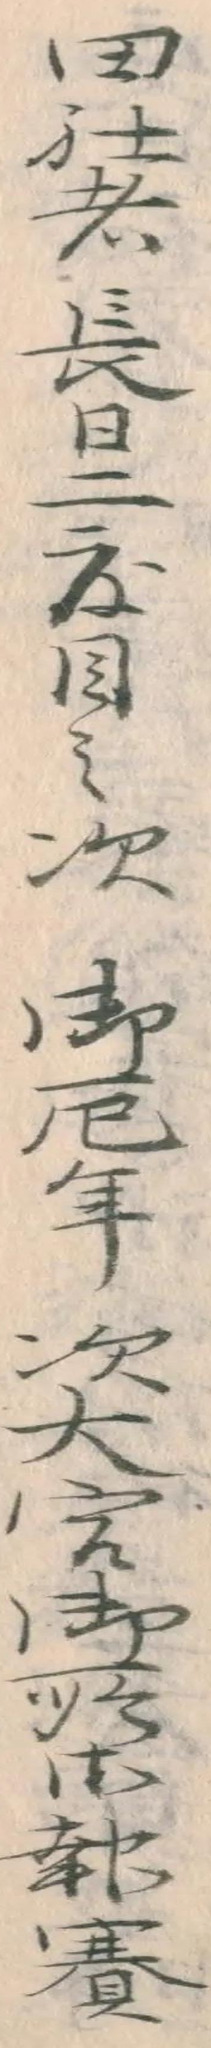田社者長日二度目之次御厄年次大宮御所御報賽
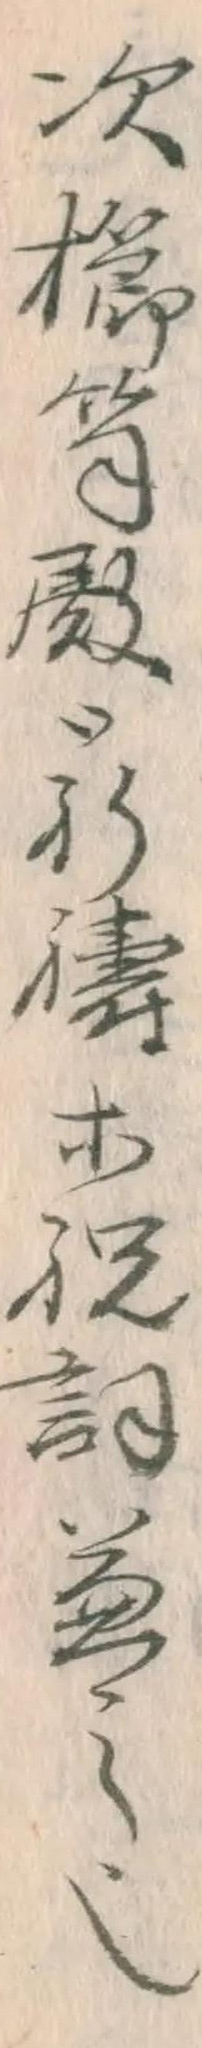次櫛笥殿御祈祷等祝詞兼之也
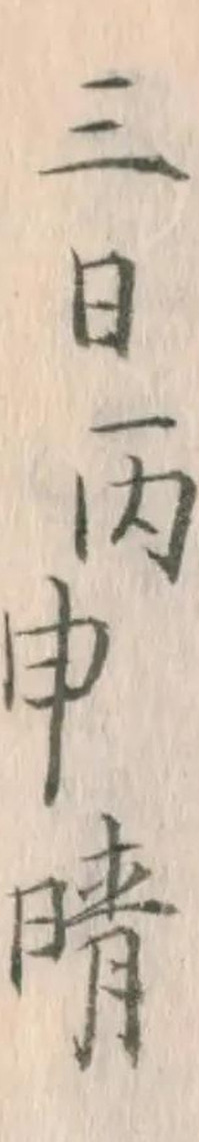三日丙申晴
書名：賀茂社記録. 第73冊
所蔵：国立国会図書館 National Diet Library, JAPAN
